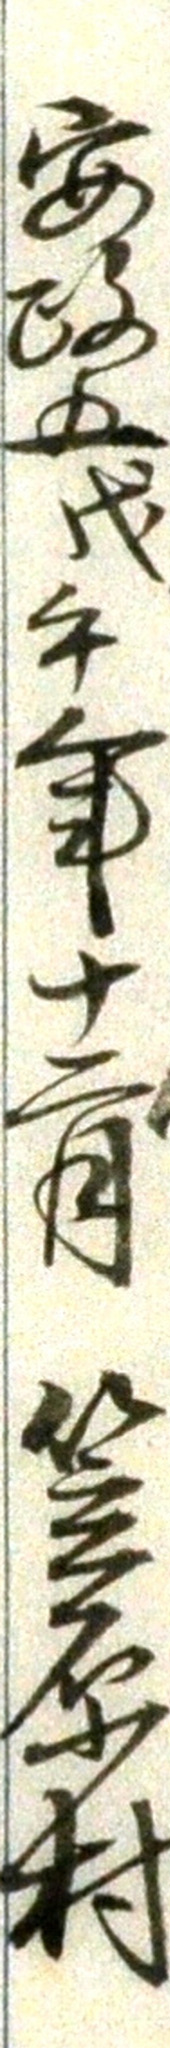安政五戊午年十二月笠原村
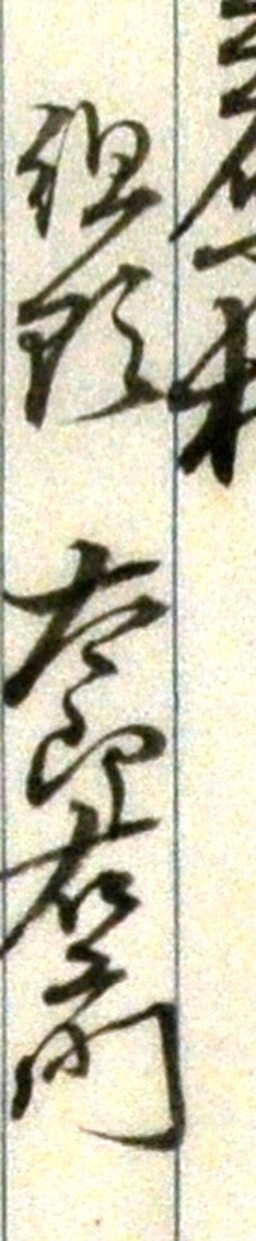組頭太郎右衛門
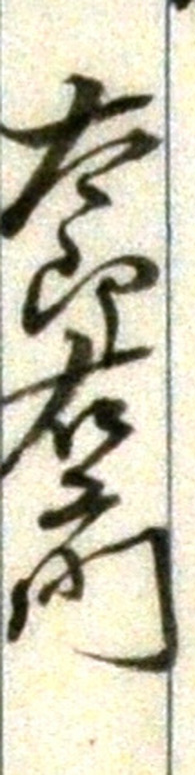同八右衛門
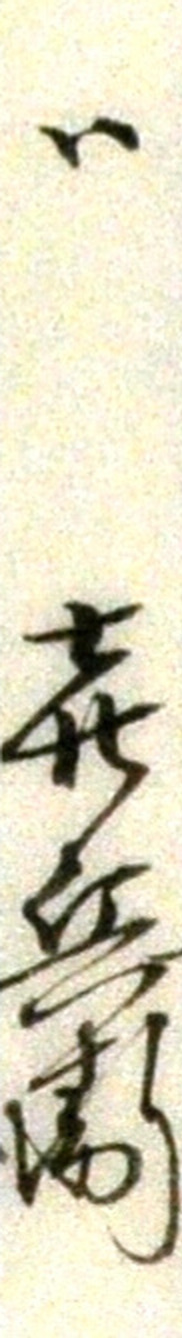同喜兵衛
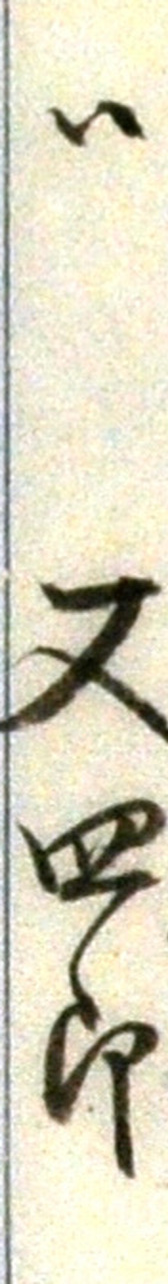同又四郎
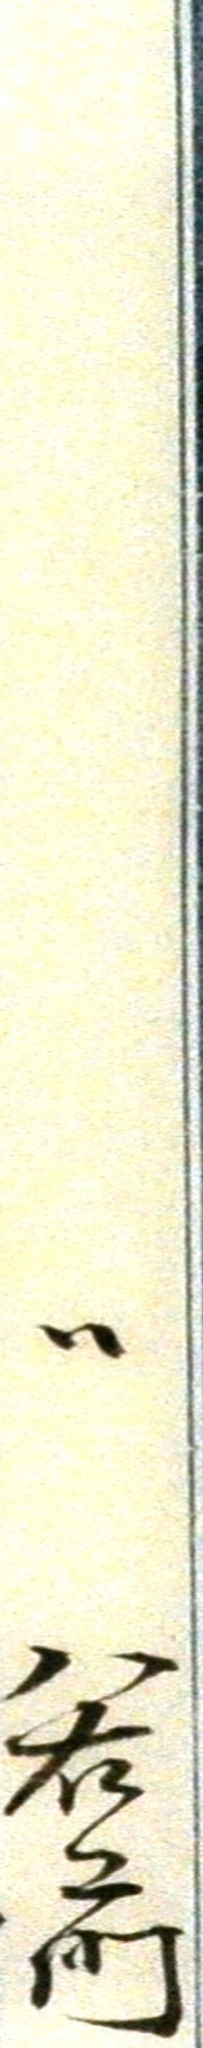同八右衛門
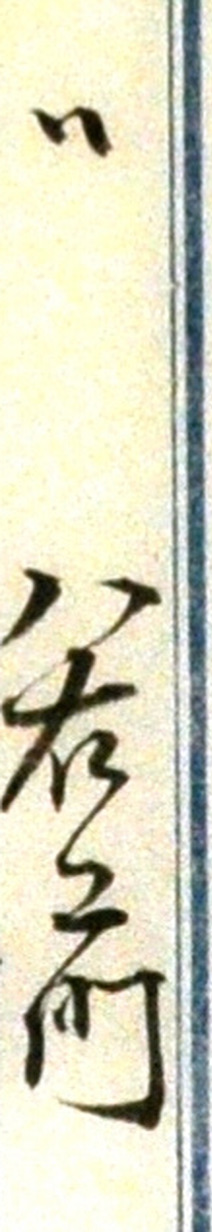同八右衛門
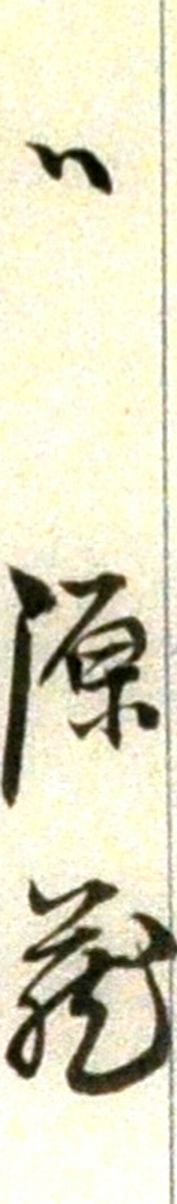同源蔵
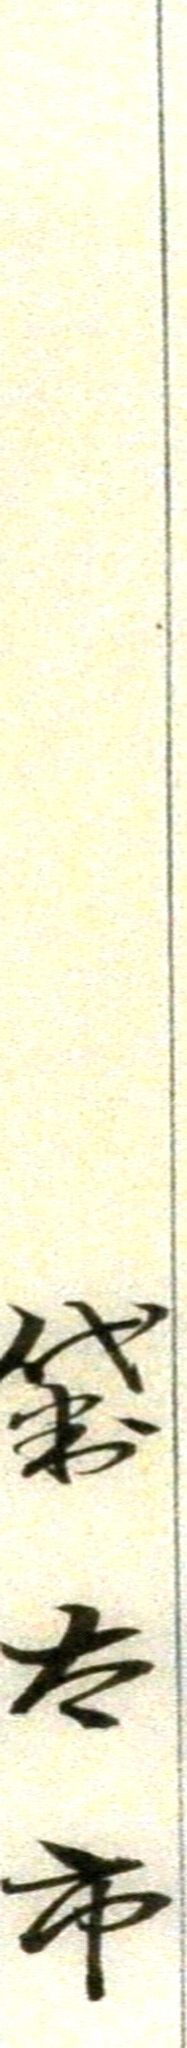代判太市
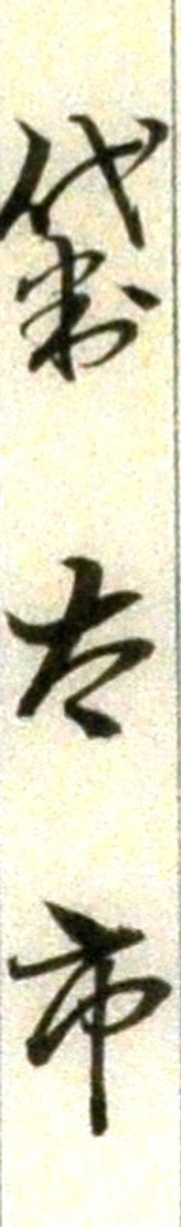代判太市
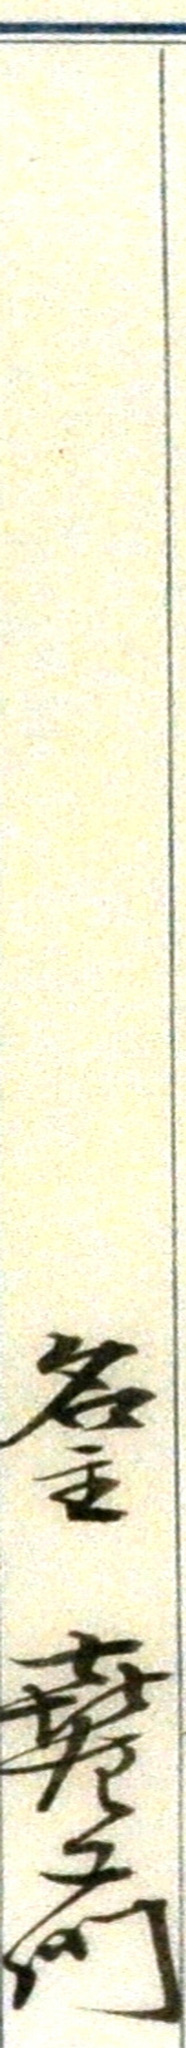名主喜左衛門
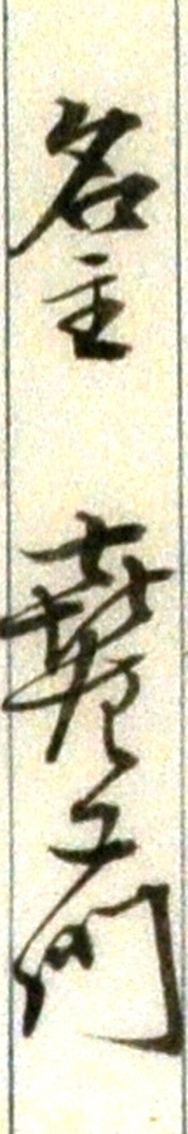名主喜左衛門
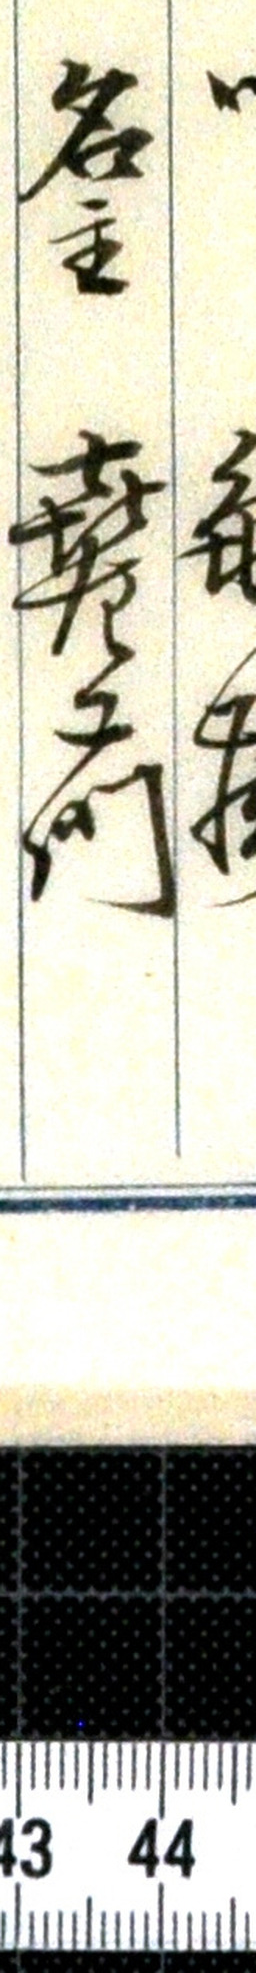名主喜左衛門
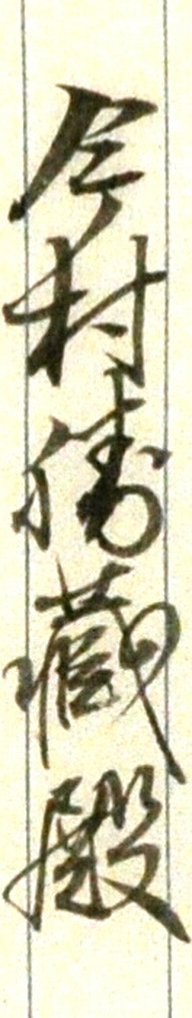今村勝蔵殿

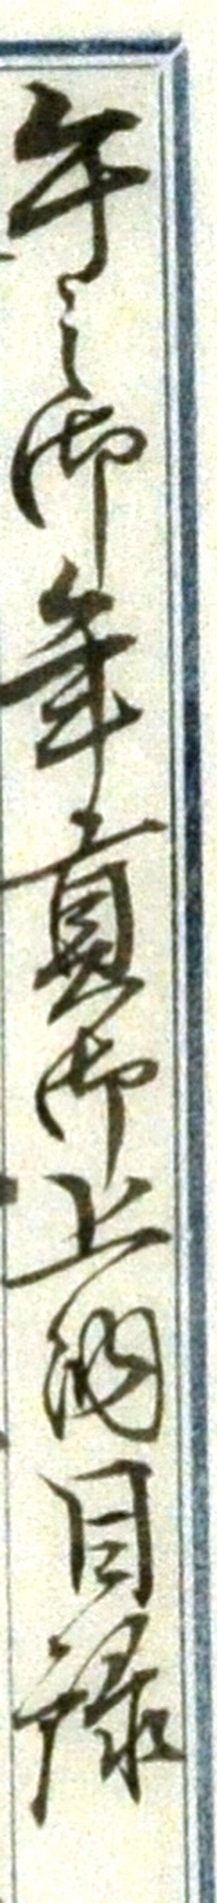午之御年貢御上納目録
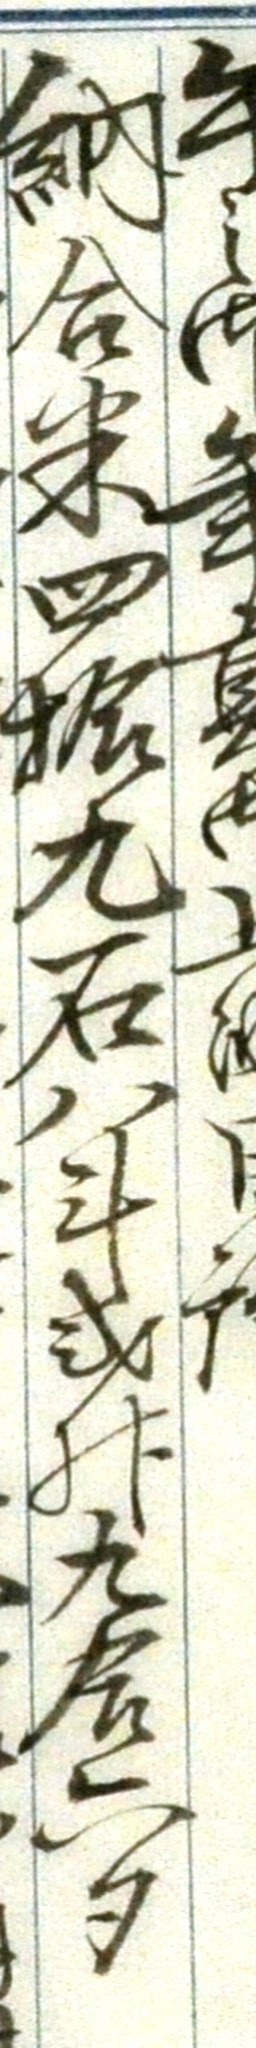納合米四拾九石八斗弐升九合六勺
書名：御蔵〆目録・御年貢御上納目録
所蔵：伊那市立高遠町図書館・合同会社AMANE
